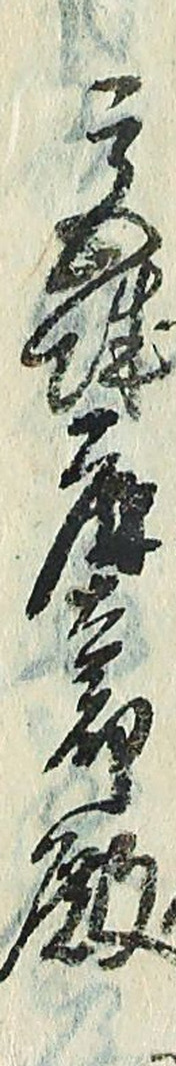宮城麻太郎殿
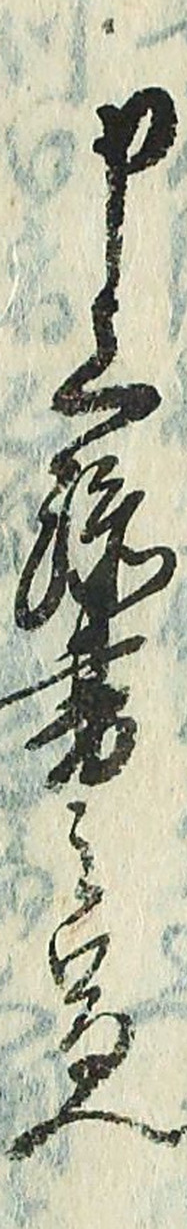申上添書之覚
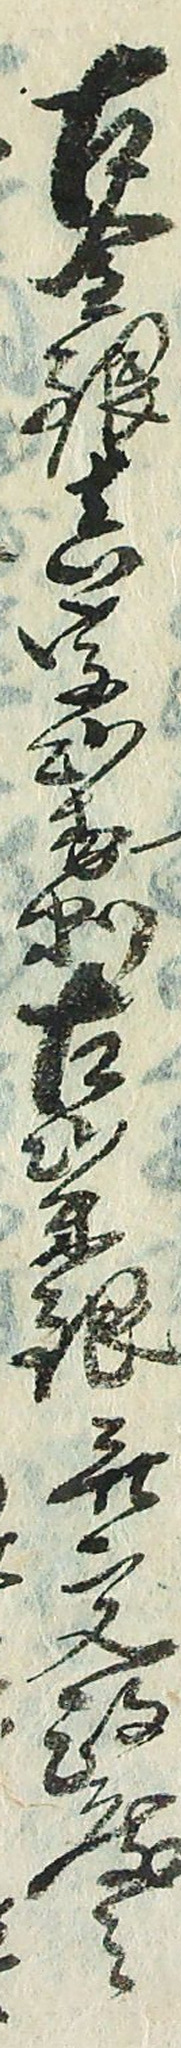古金銀真字弐歩判古弐朱銀幷文政度之
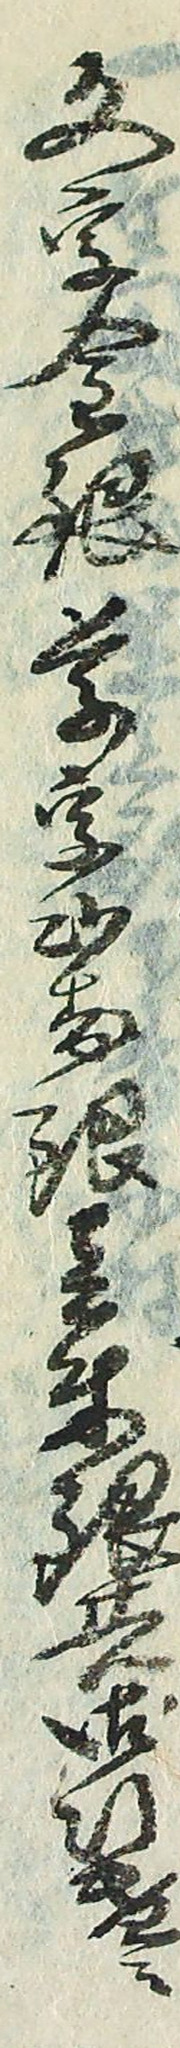文字金銀草字弐歩銀壱朱銀共御引替之
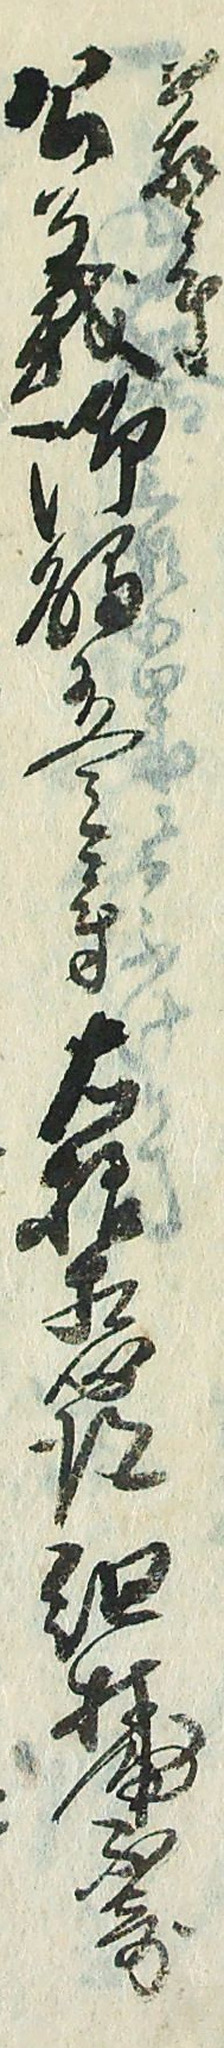公義御触有之に付右様相心得組村浦不寄
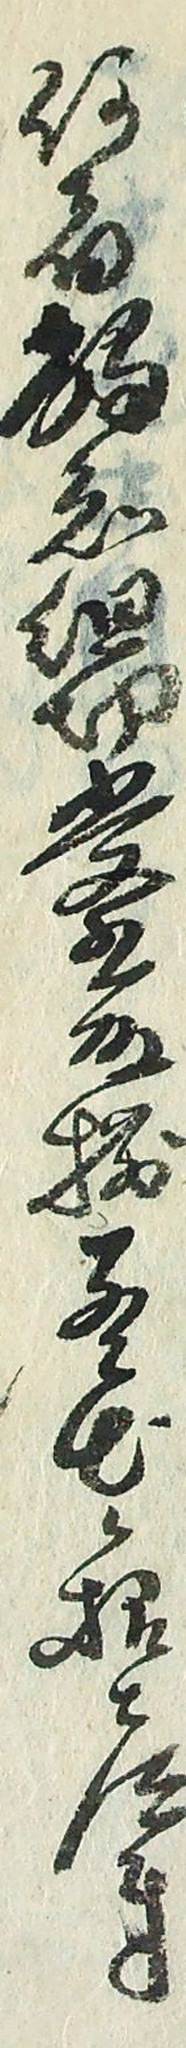何者触知組切受書取揃差出候様被仰付
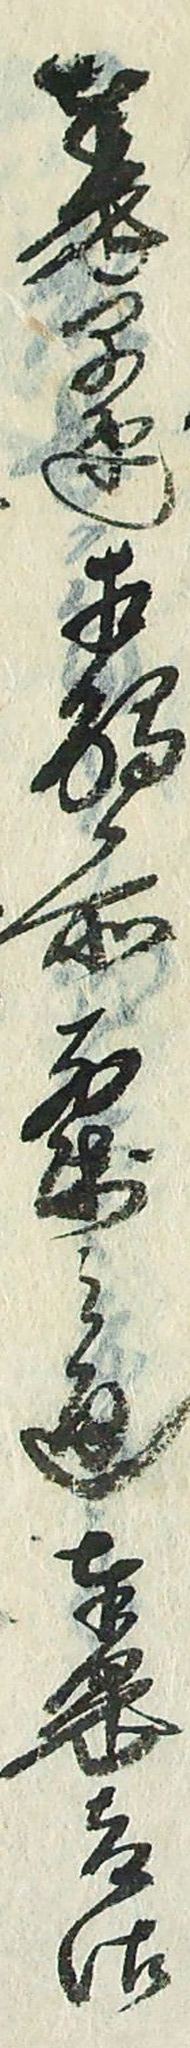奉畏早速相触候所別帋之通奉畏旨御
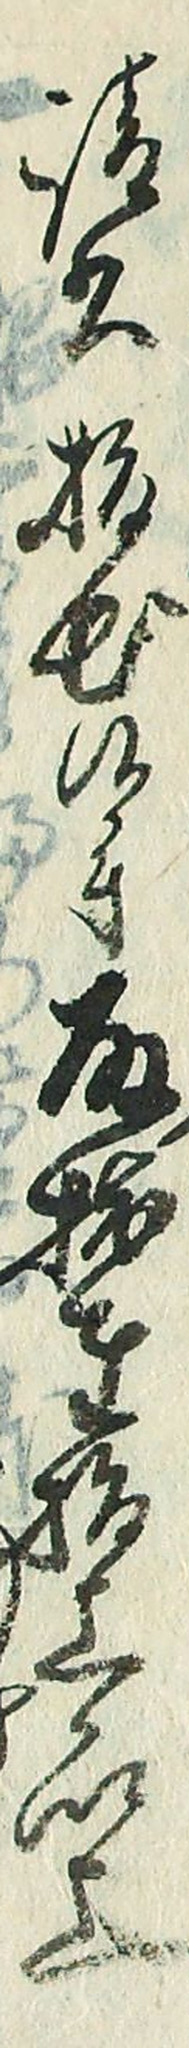請書指出候に付取揃奉指上候以上
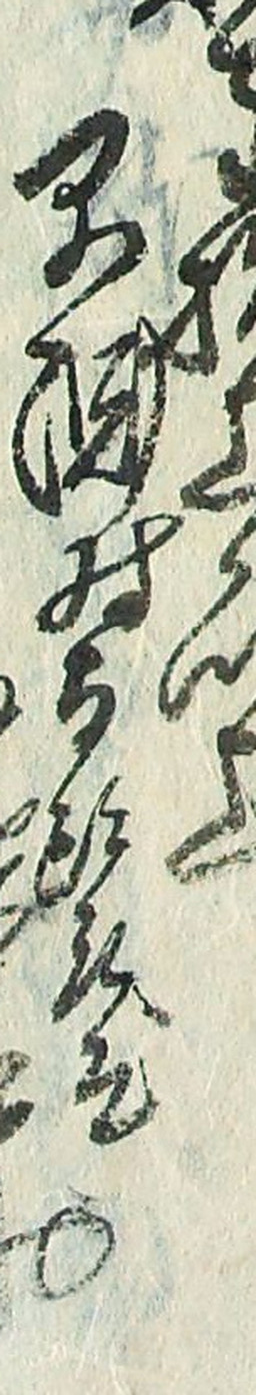早淵村与頭庄屋

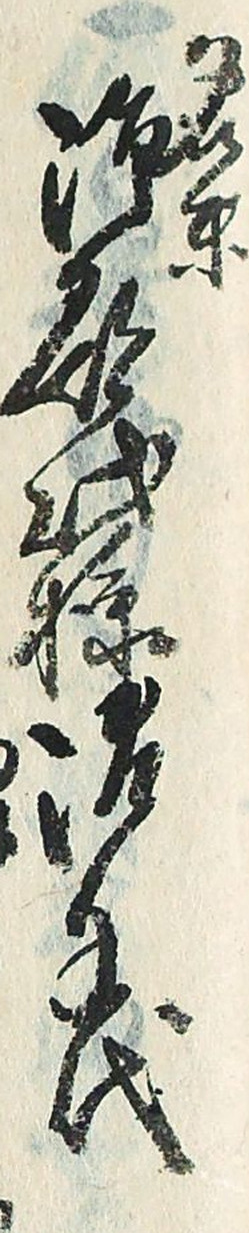御郡代様御手代
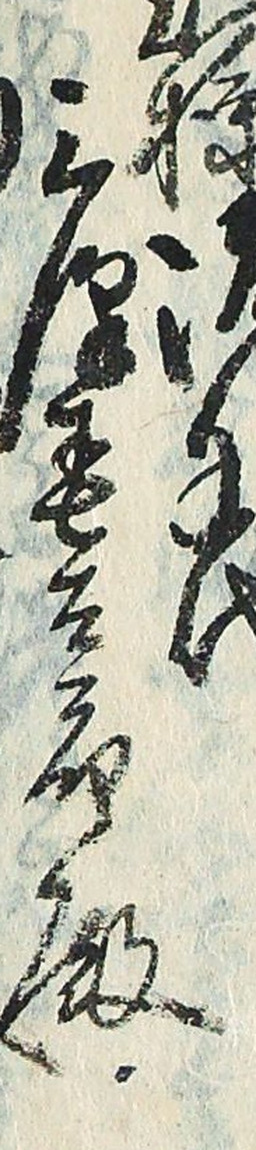三沢春太郎殿
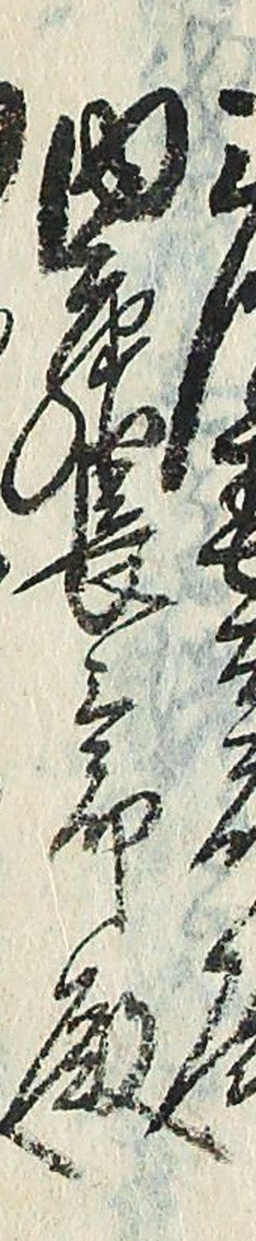内藤長三郎殿
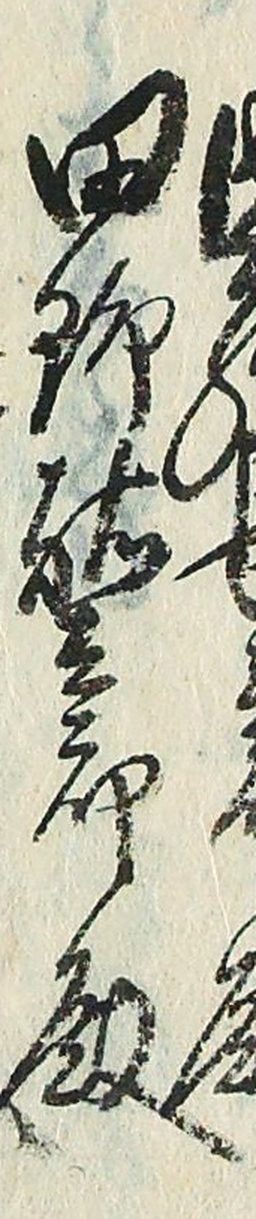田野祐太郎殿
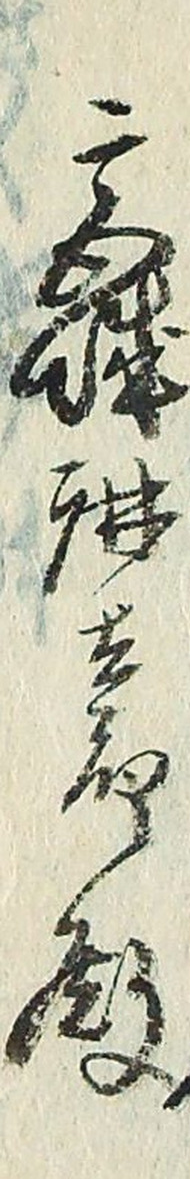宮城麻太郎殿
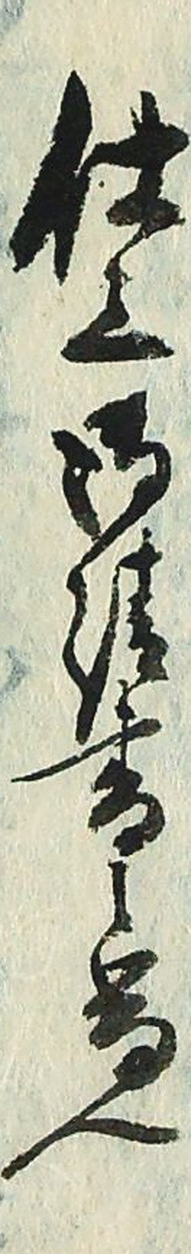仕上御請書之覚
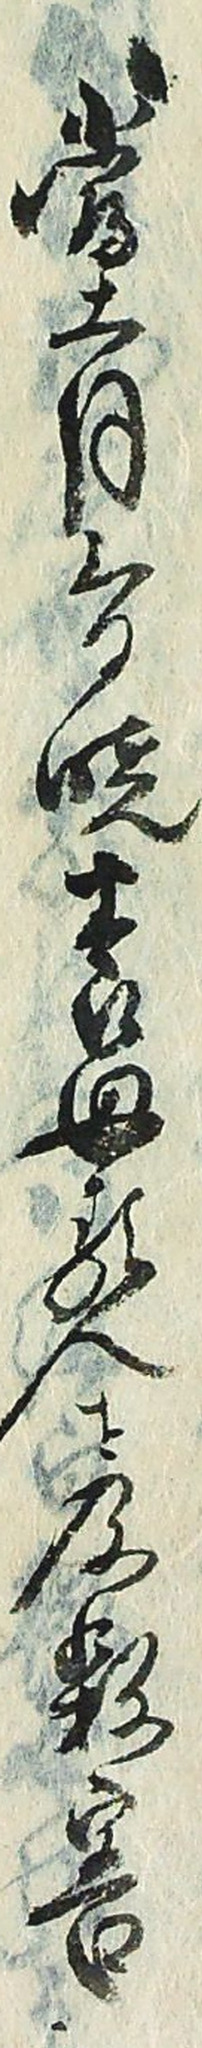当十一月三日暁養母るんを及殺害
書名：諸御用御□受書控
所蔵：鳴門教育大学 Naruto University of Education
